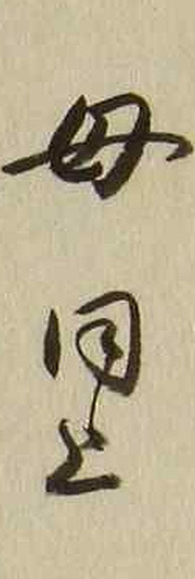母同上
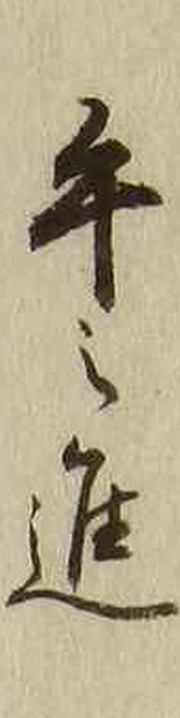午之進
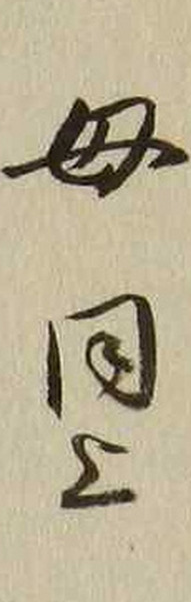母同上
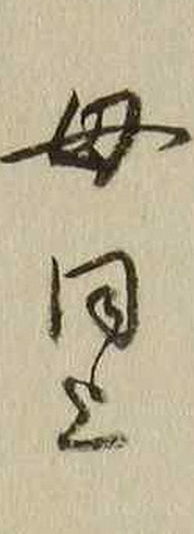母同上
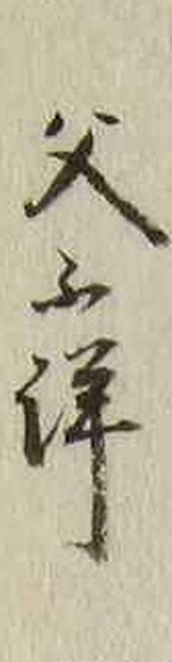父不詳
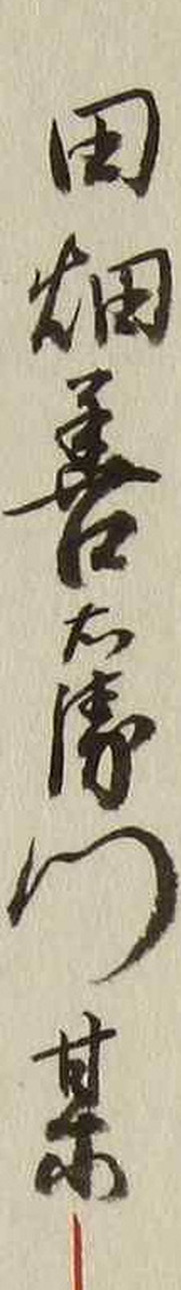田畑善右衛門某
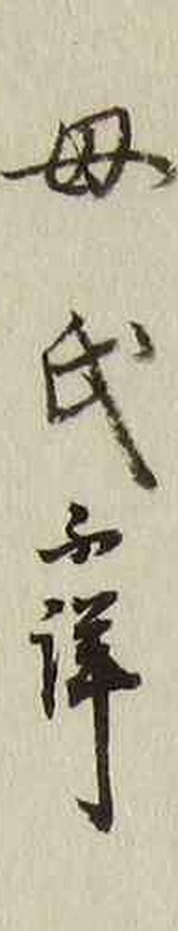母氏不詳
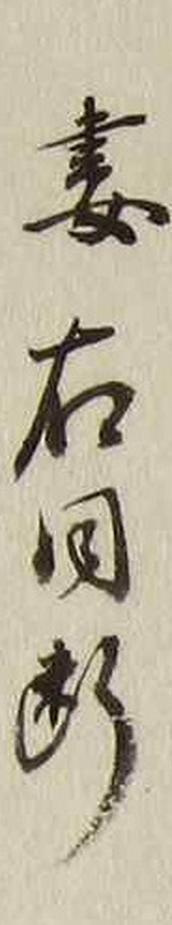妻右同断

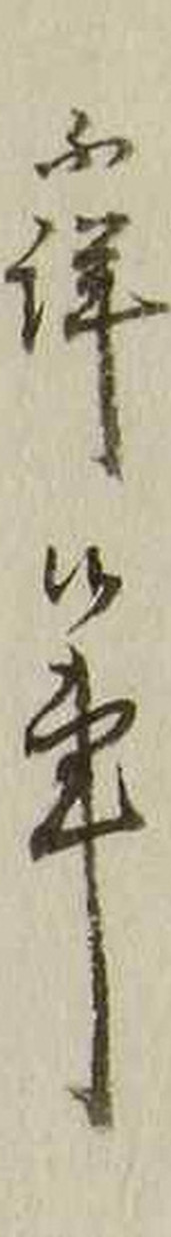不詳候事
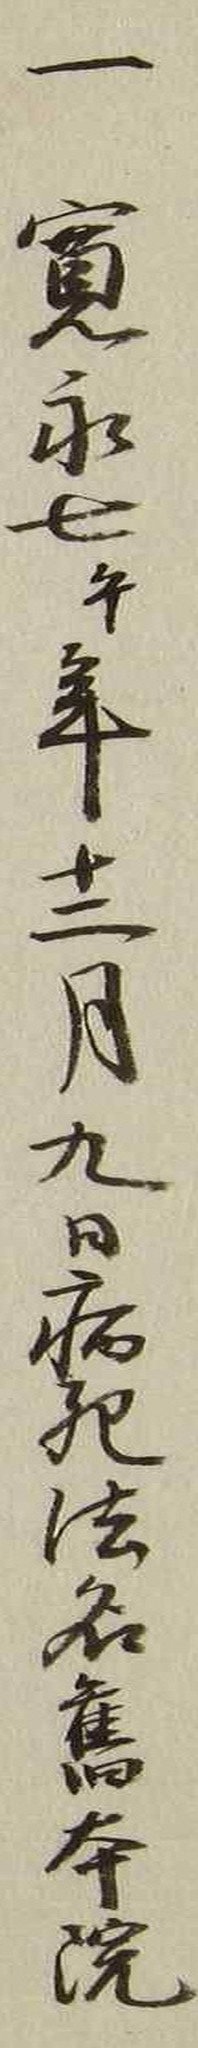一寛永七午年十二月九日病死法名舊本院
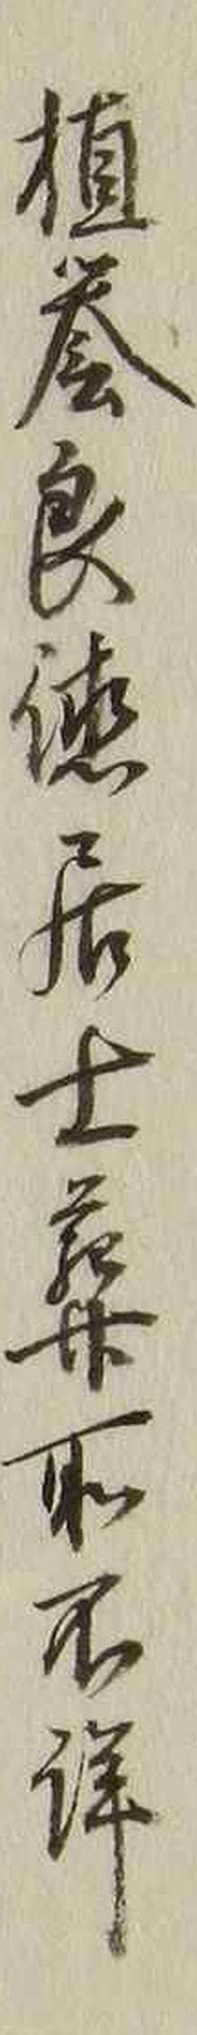植誉良徳居士葬所不詳
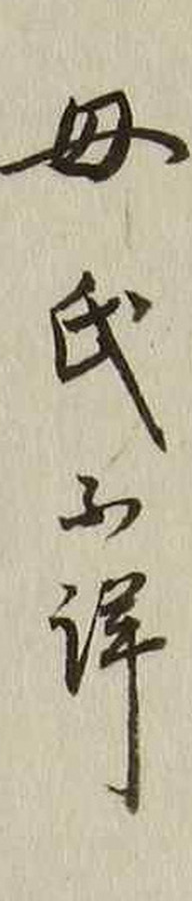母氏不詳
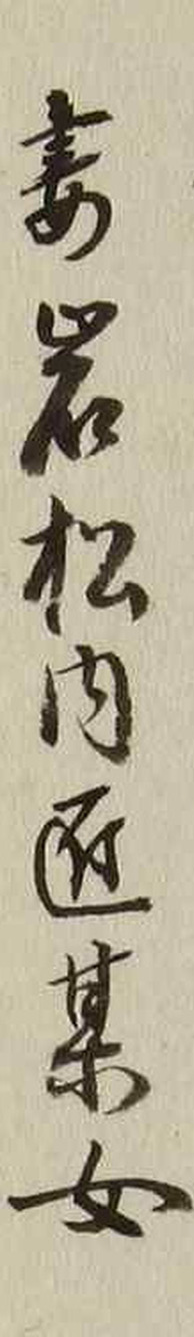妻岩松内匠某女
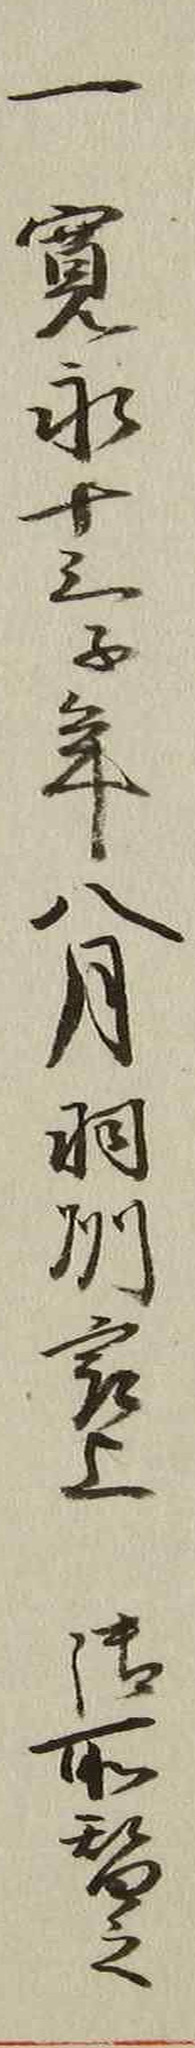一寛永十三子年八月羽州最上御所替之
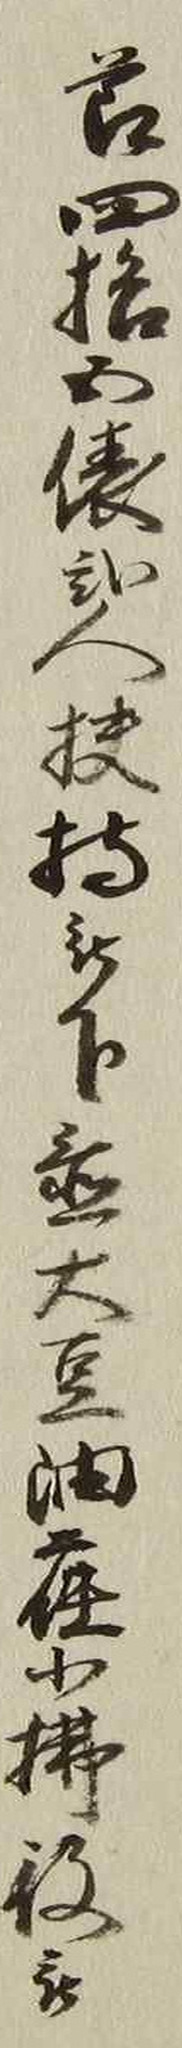節四拾五俵弐人扶持被下置大豆油荏少払役被
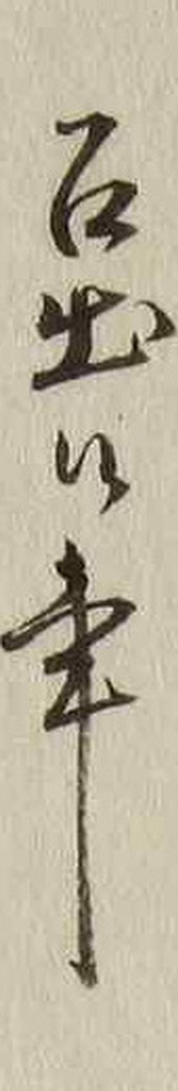召出候事
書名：諸士系譜　巻之128　た之部4
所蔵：会津若松市立会津図書館
